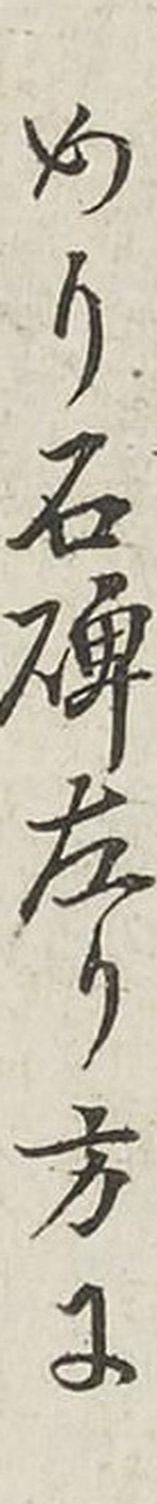めり石碑左り方に
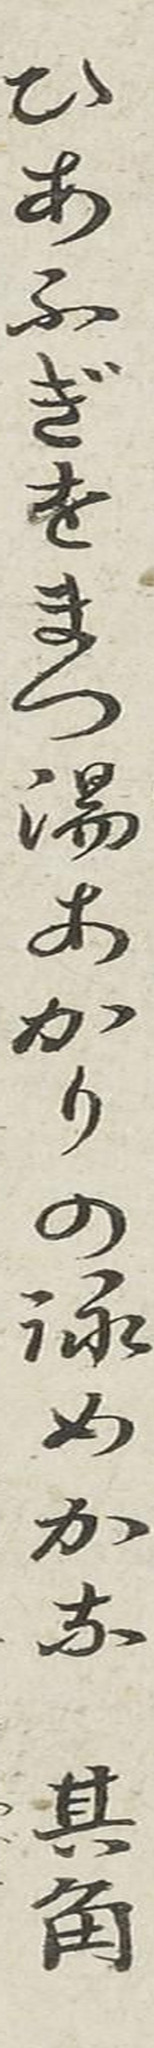ひあふぎをまつ湯あかりの詠めかな其角
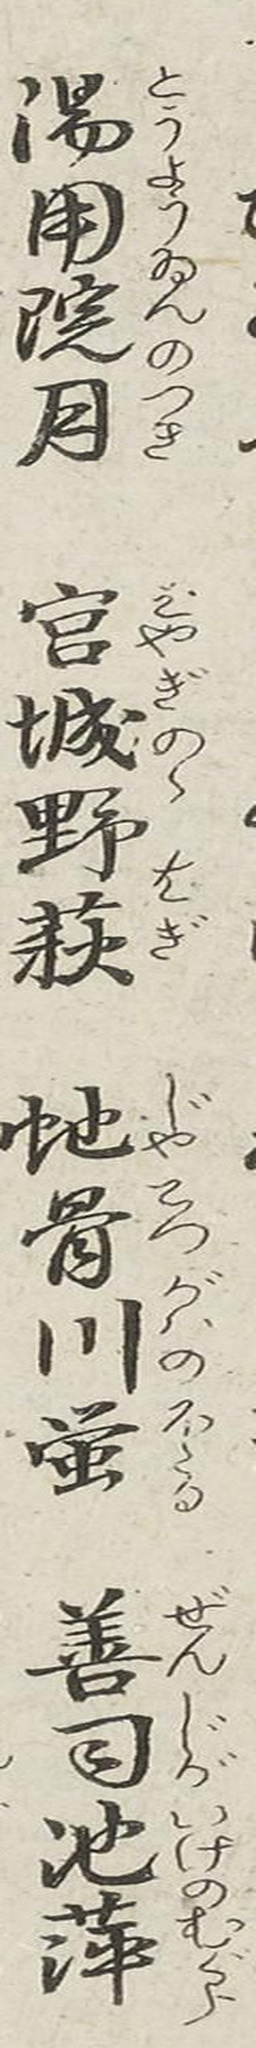湯用院月宮城野萩蛇骨川蛍善司池葎
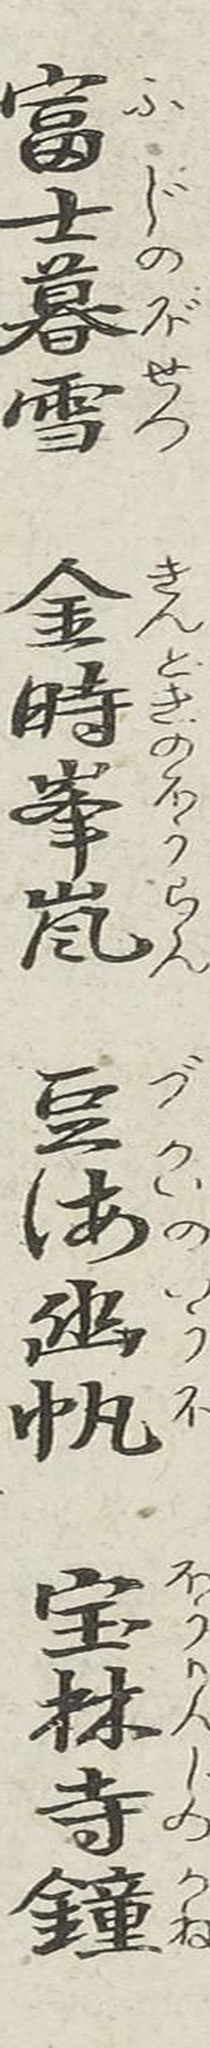富士暮雪金時峯嵐豆海幽帆宝林寺鐘
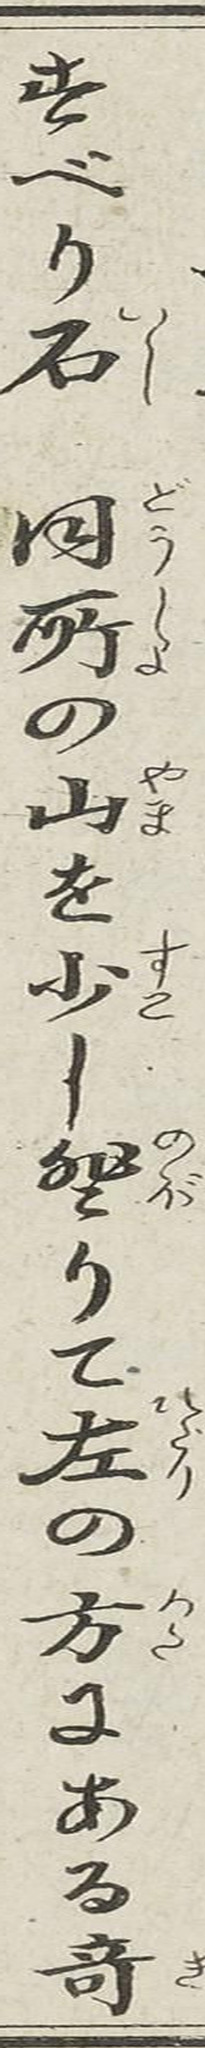すべり石同所の山を少し登りて左の方にある奇
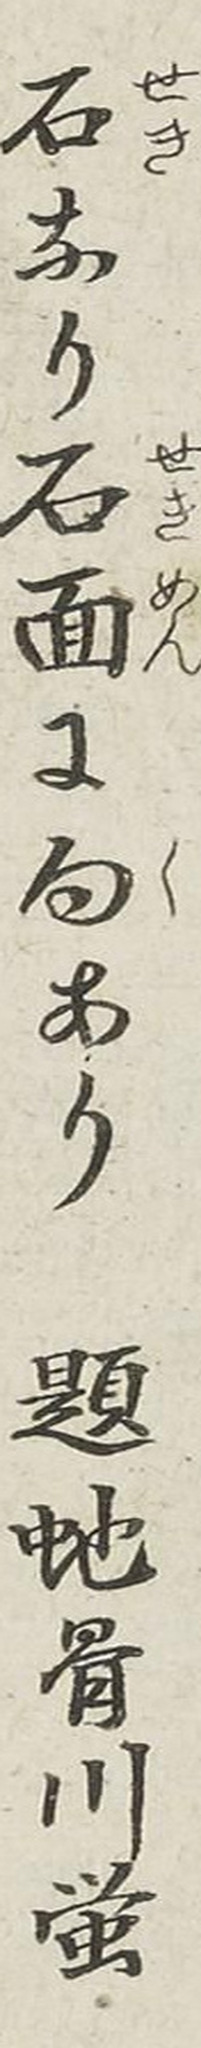石なり石面に句あり題蛇骨川蛍
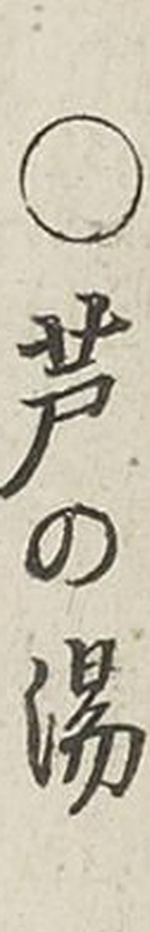〇芦の湯
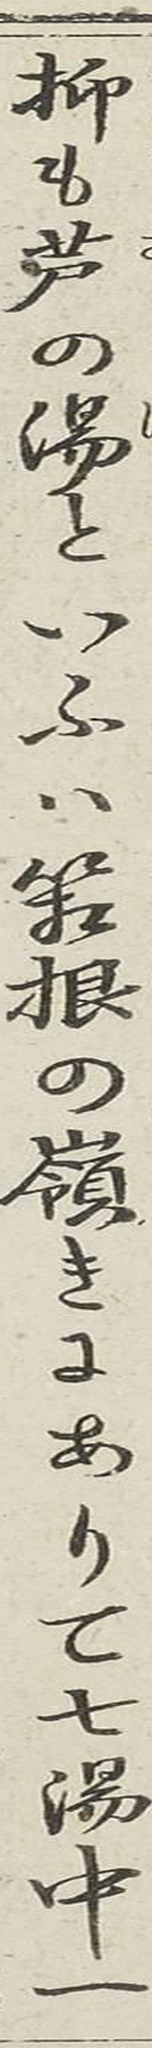抑も芦の湯といふは箱根の嶺きにありて七湯中一
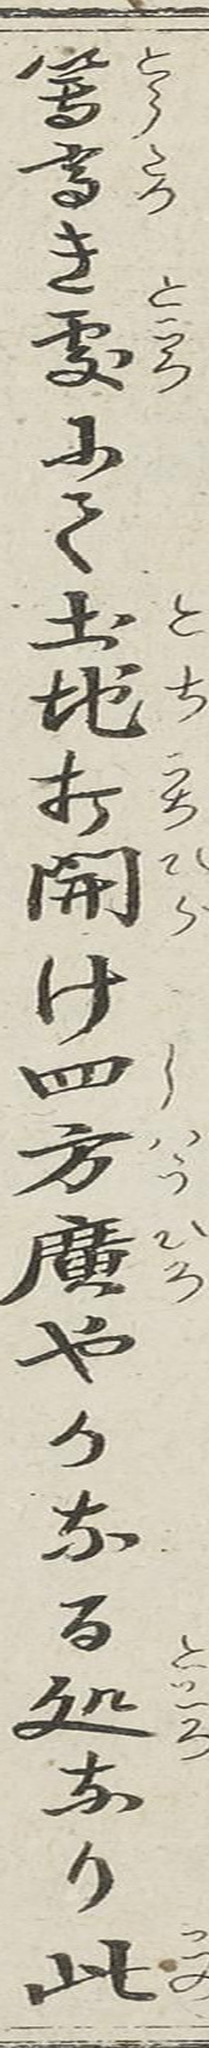等高き処にて土地打開け四方広やかなる処なり此
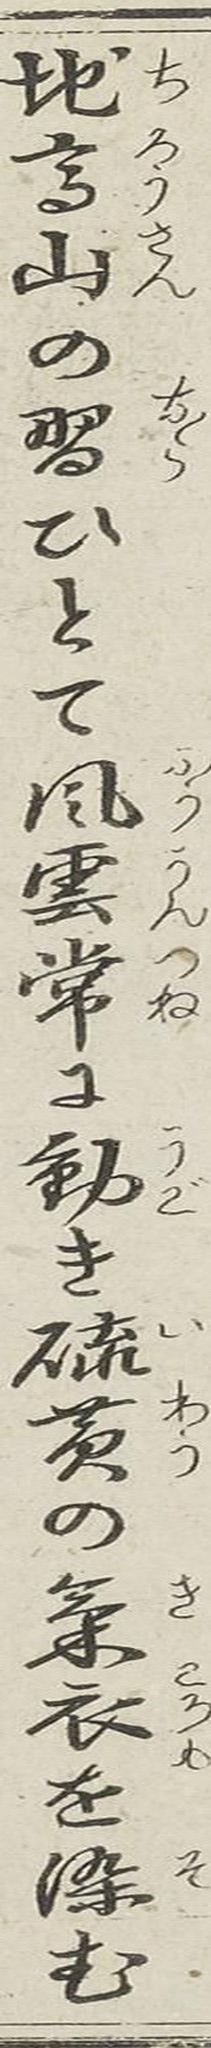地高山の習ひとて風雲常に動き硫黄の気衣を染む
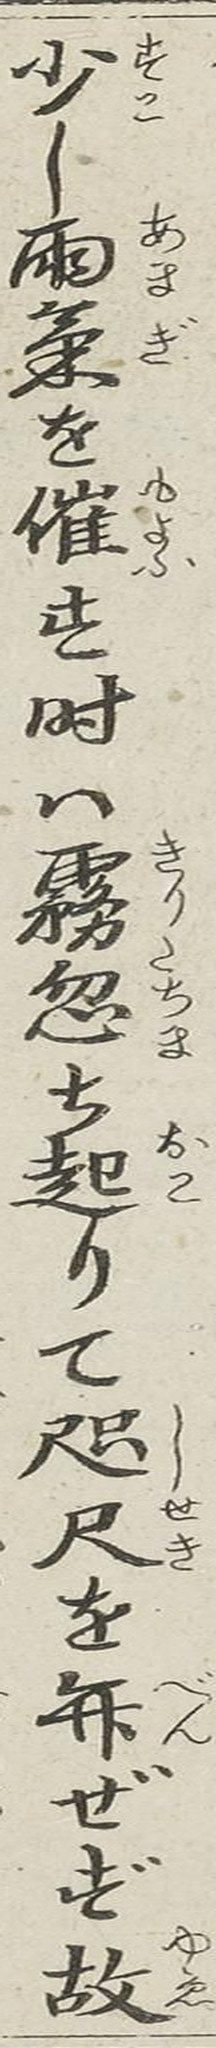少し雨気を催す時は霧忽ち起りて咫尺を弁ぜず故
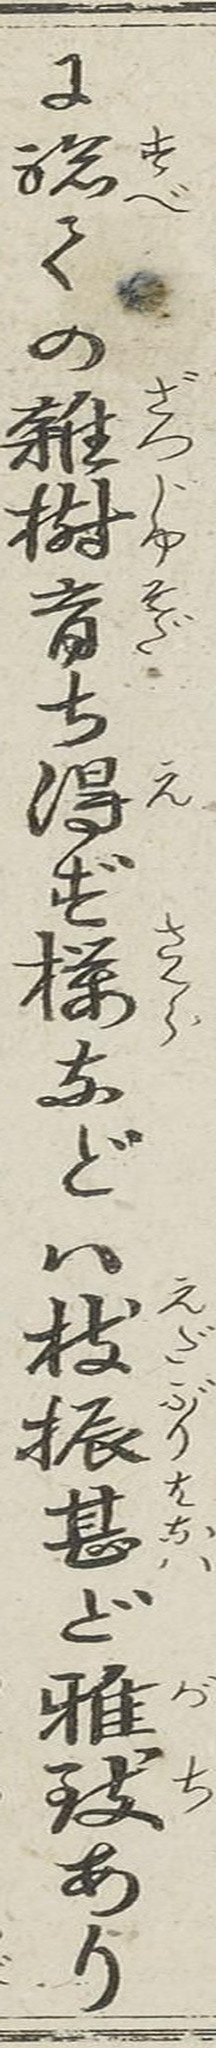に諸ての雑樹育ち得ず桜などは枝振甚だ雅致あり
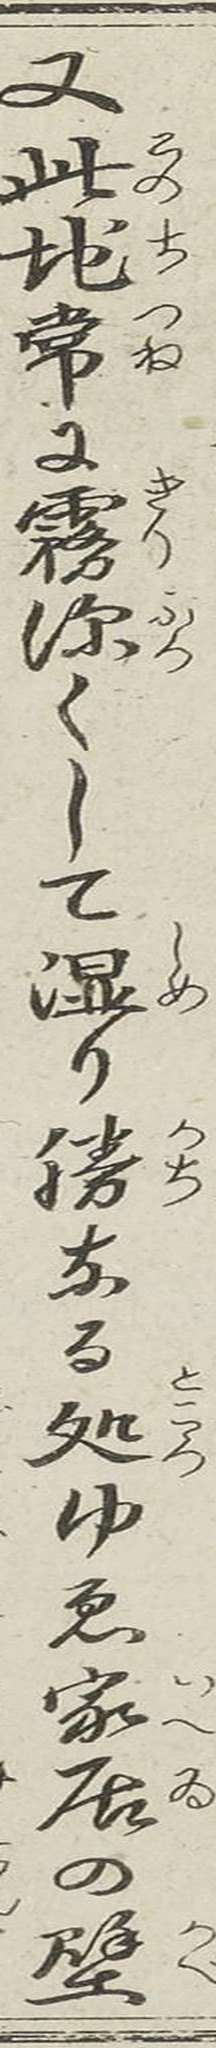又此地常に霧深くして湿り勝なる処ゆゑ家居の壁
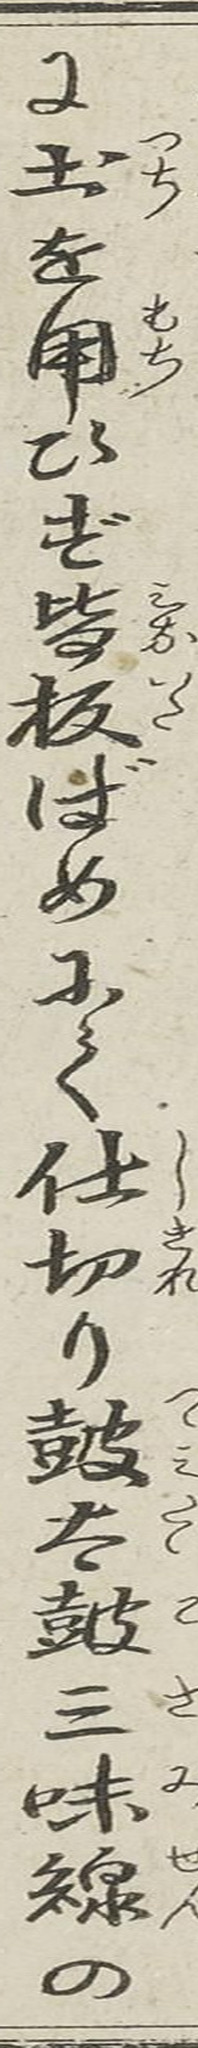に土を用ひず皆板ばめにて仕切り鼓太鼓三味線の
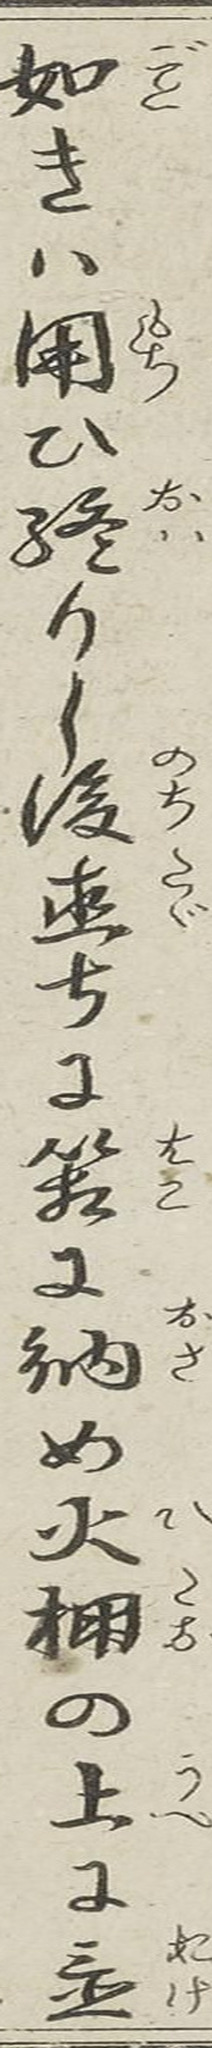如きは用ひ終りし後直ちに箱に納め火棚の上に置
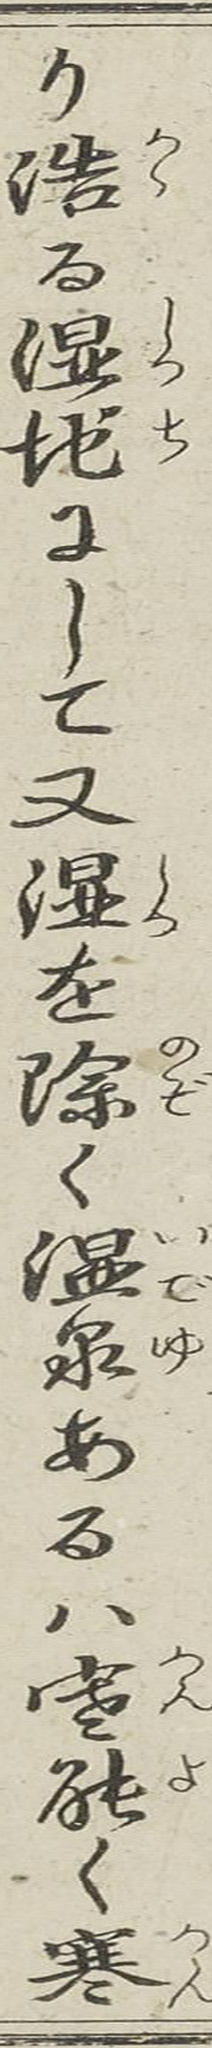り浩る湿地にして又湿を除く温泉あるは寒能く寒
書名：箱根温泉誌　全
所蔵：東京大学地震研究所図書室 Earthquake Research Institute Library, The University of Tokyo, JAPAN
